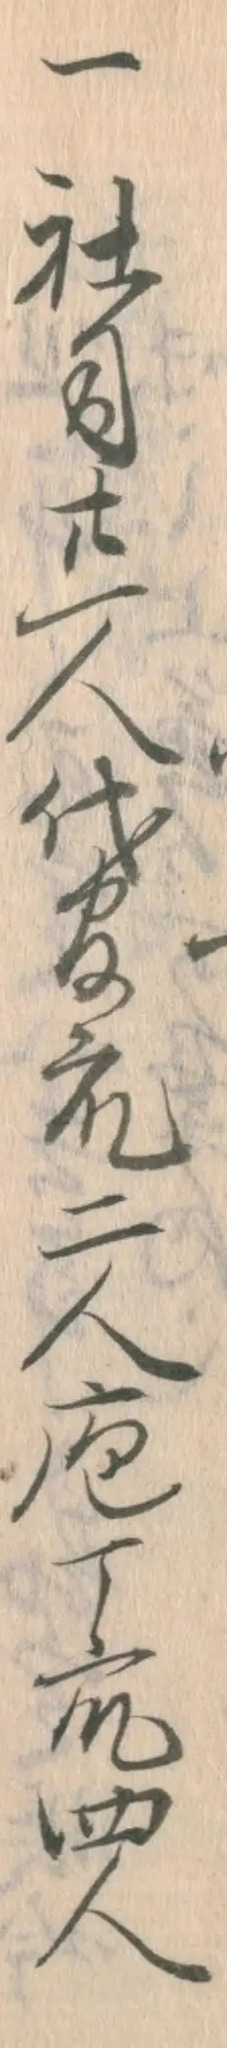一社司廿一人代官衆二人庖丁衆四人
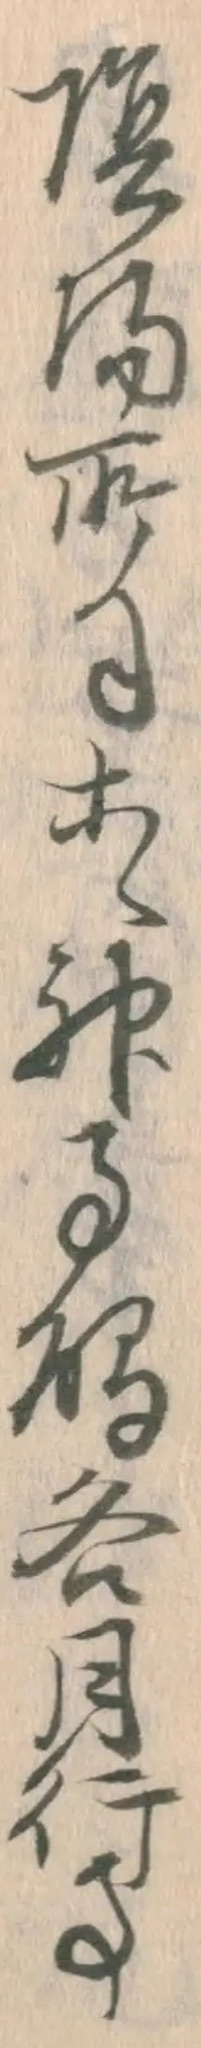陰陽所司等へ神事触各月行事
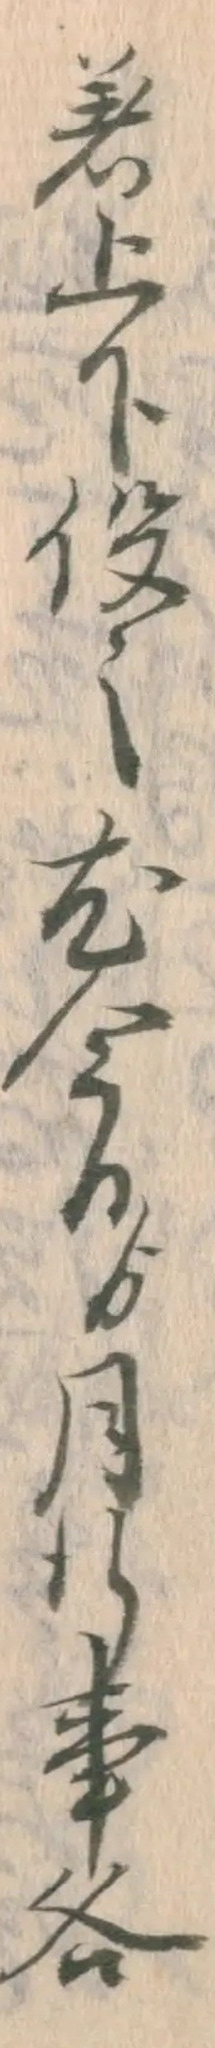着上下役之尤今日ゟ月行事各
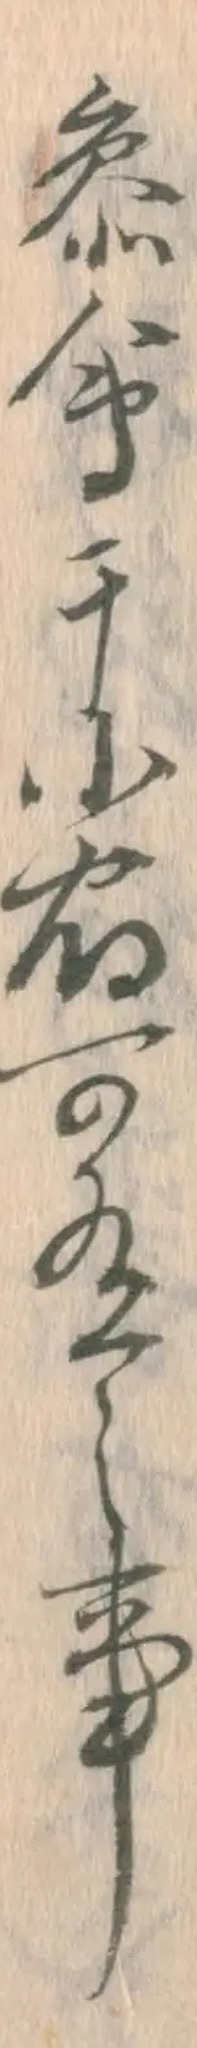参会于小宿可有之事
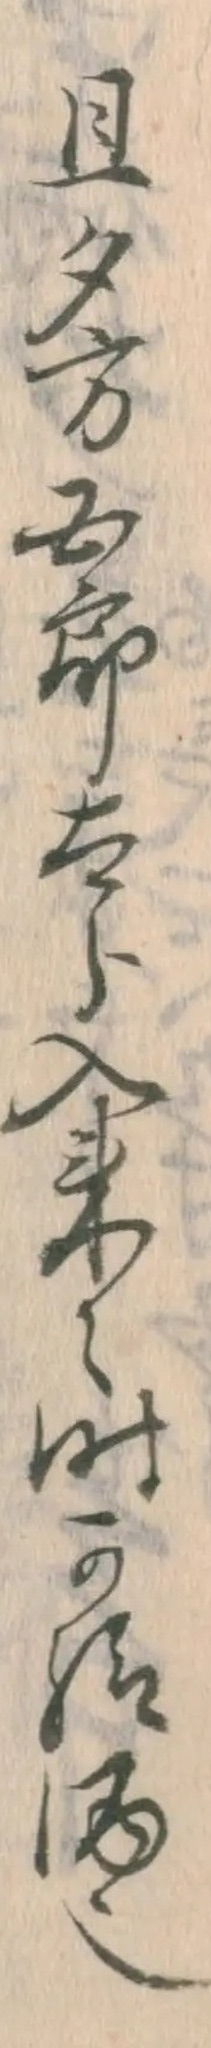且夕方五郎太郎入来之時可給酒也
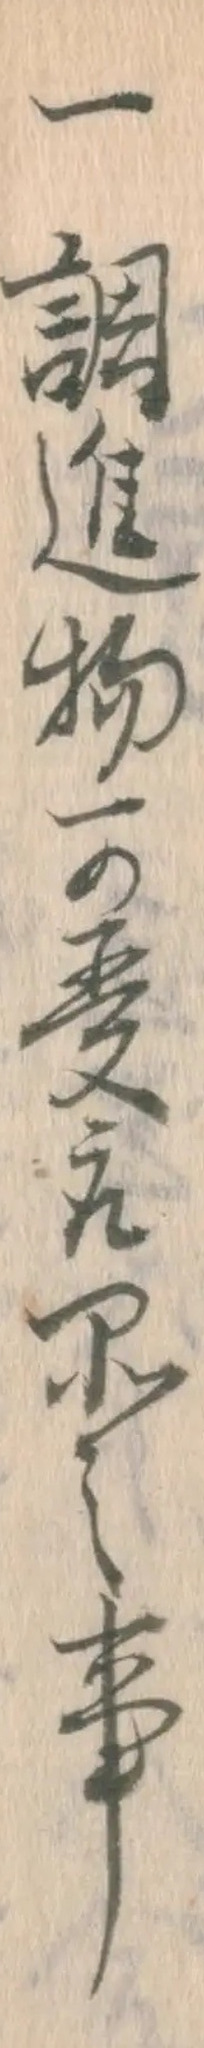一調進物可受取品之事
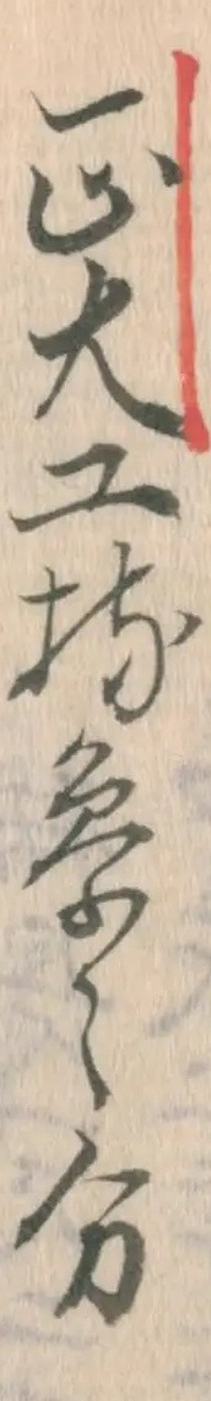正大工持参之分
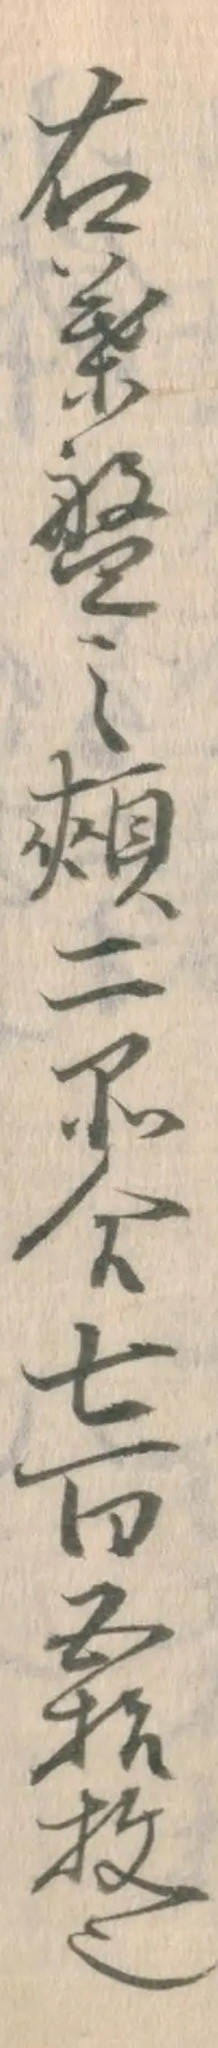右葉盤之頬二品合七百五拾枚也
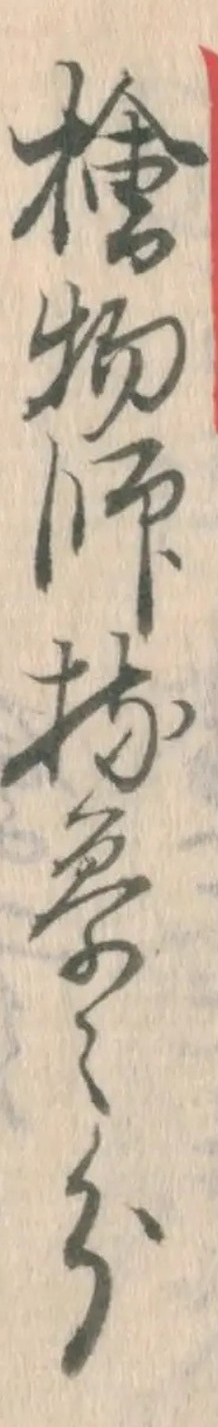檜物師持参之分

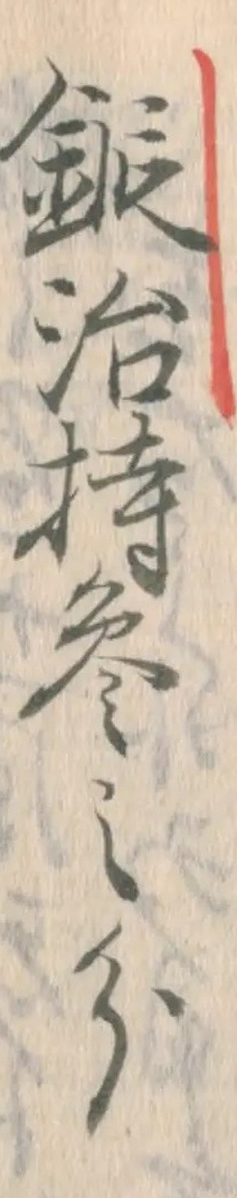鍛治持参之分
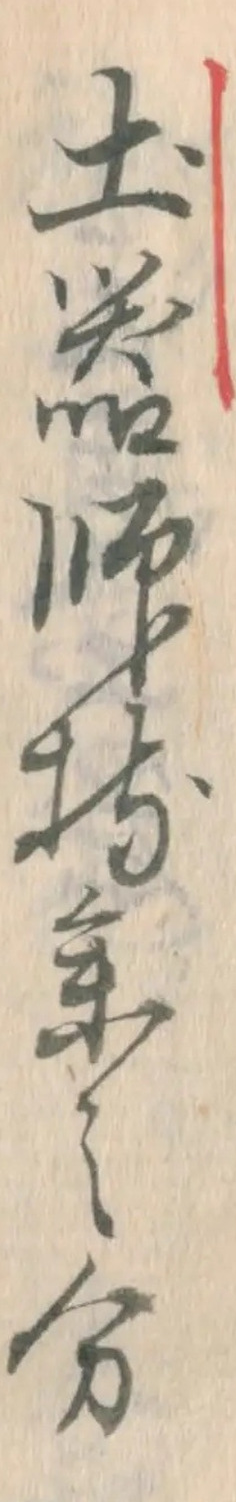土器師持参之分

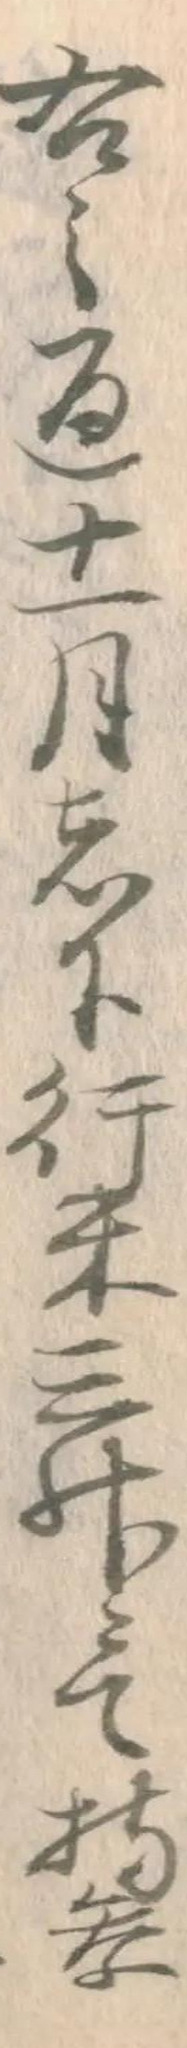右之通十一月者下行米三升にて持参
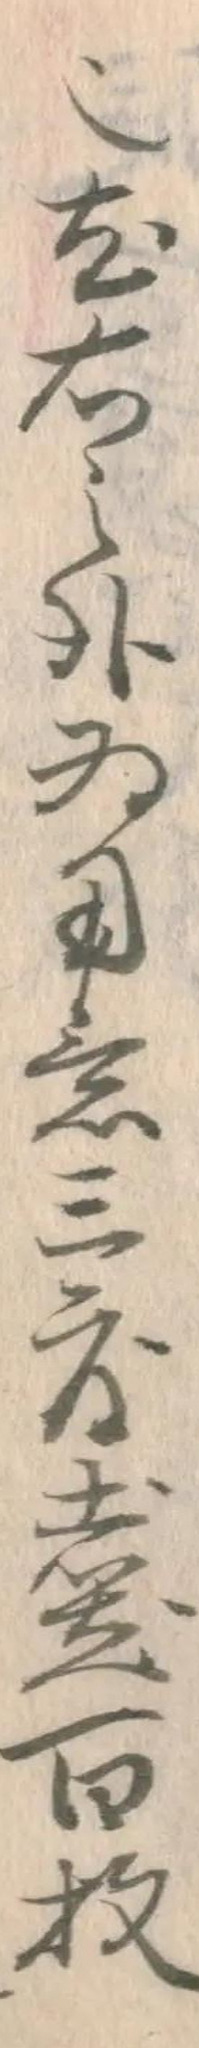也尤右之外為用意三度土器百枚
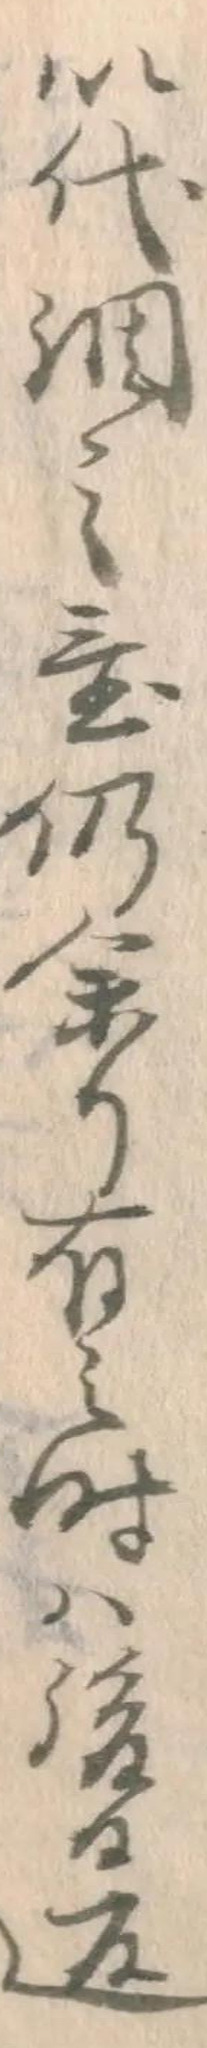以代調之置仍余り有之時は後日返
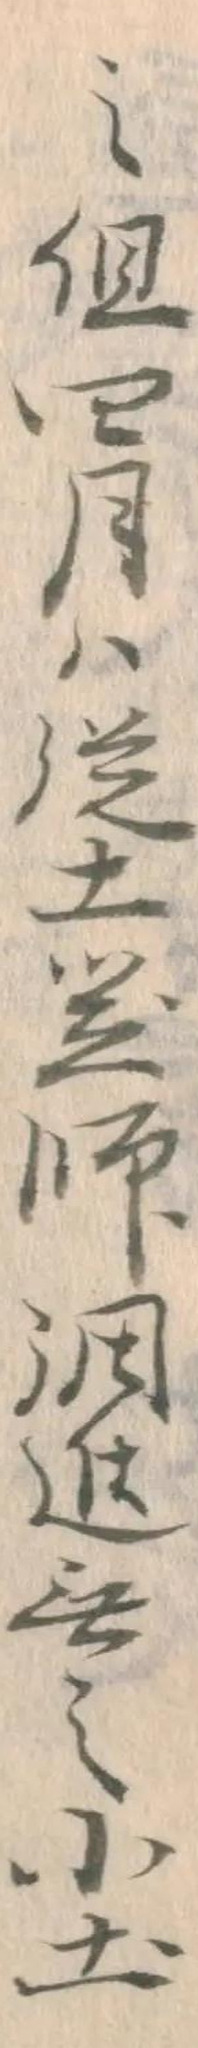之但四月は従土器師調進無之小土
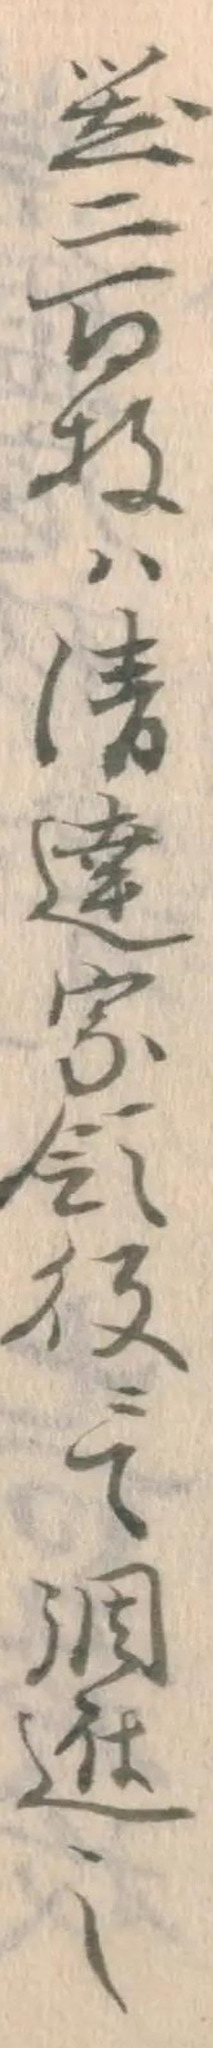器二百枚は清達宗領役にて調進之
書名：賀茂社記録. 第81冊
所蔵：国立国会図書館 National Diet Library, JAPAN
